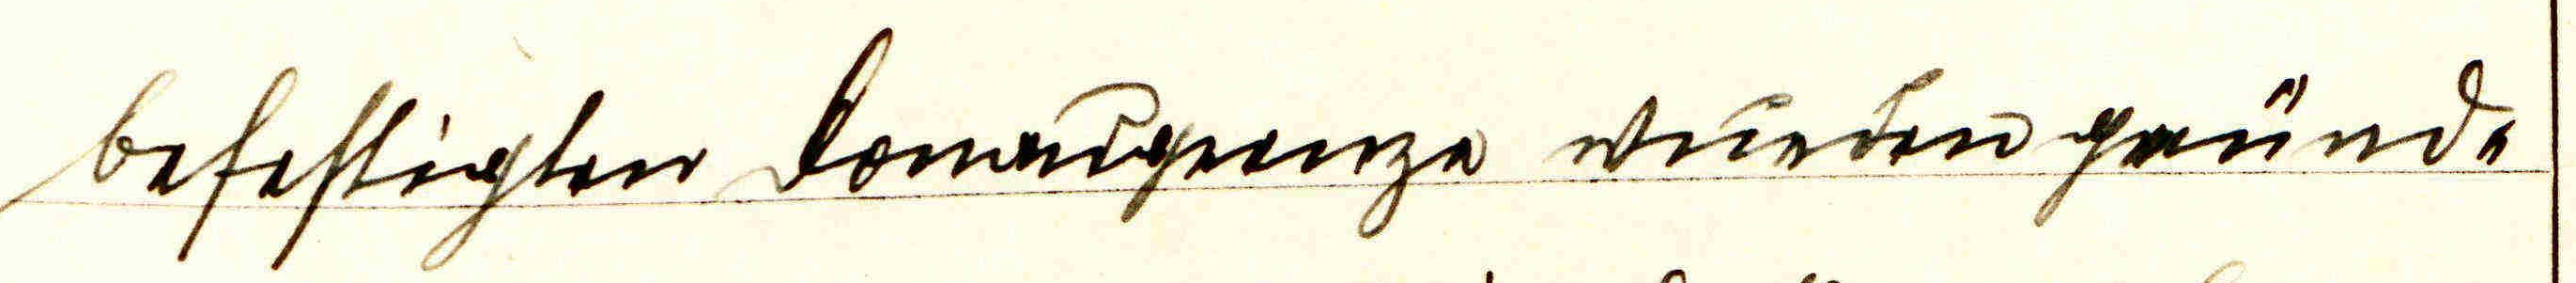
befestigten Donaugrenze wurden gründ-
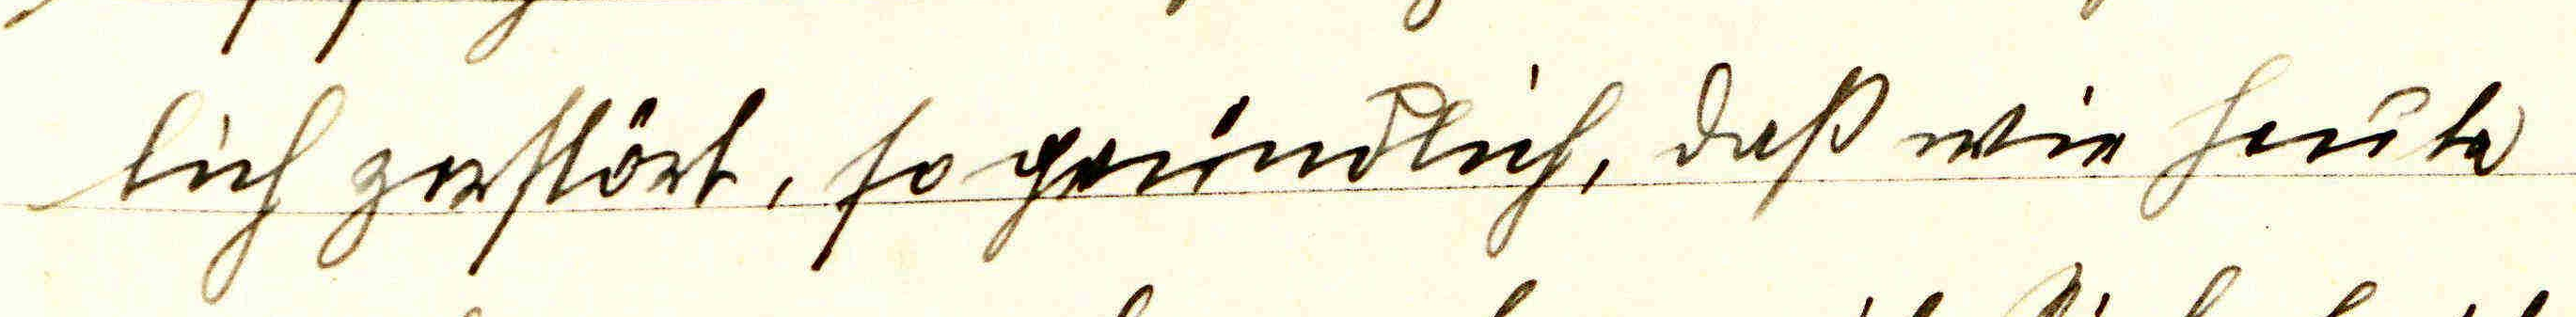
lich zerstört, so gründlich, daß wir heute
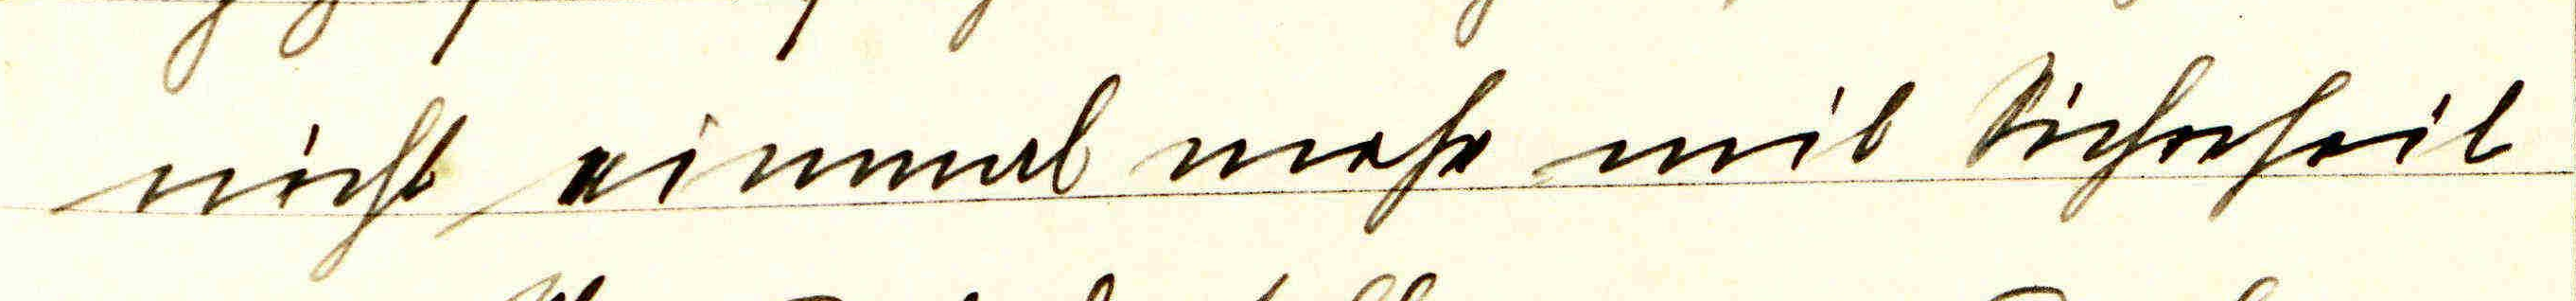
nicht einmal mehr mit Sicherheit
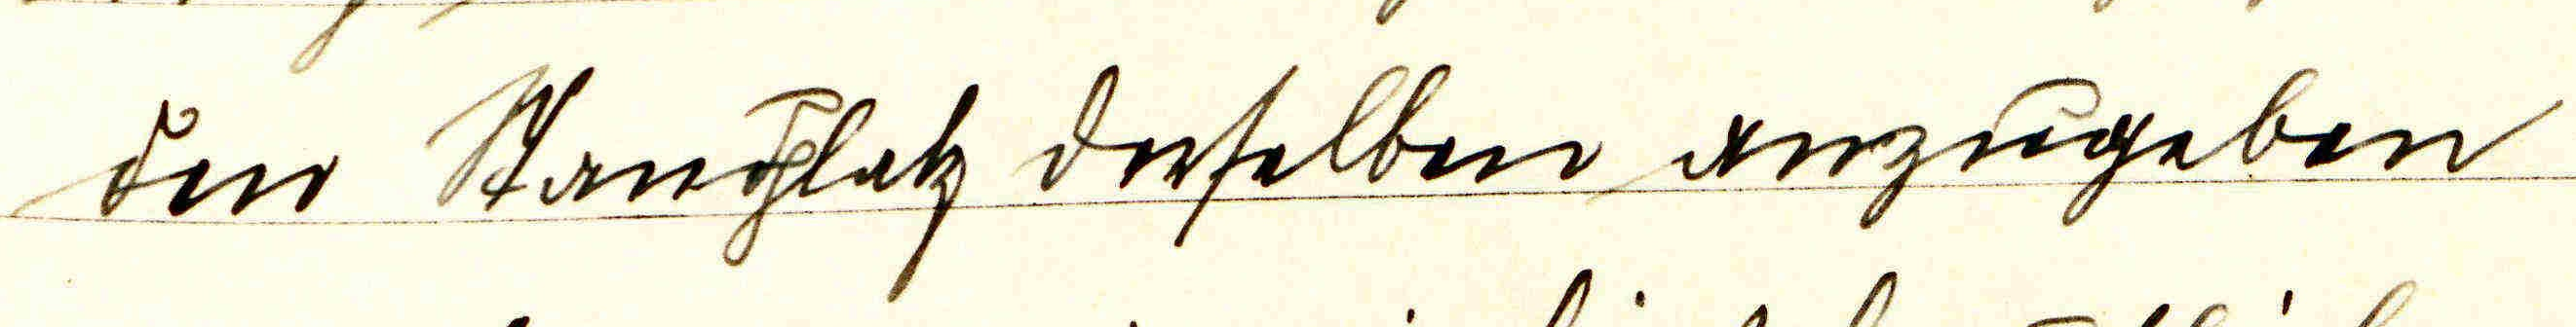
den Standplatz derselben anzugeben
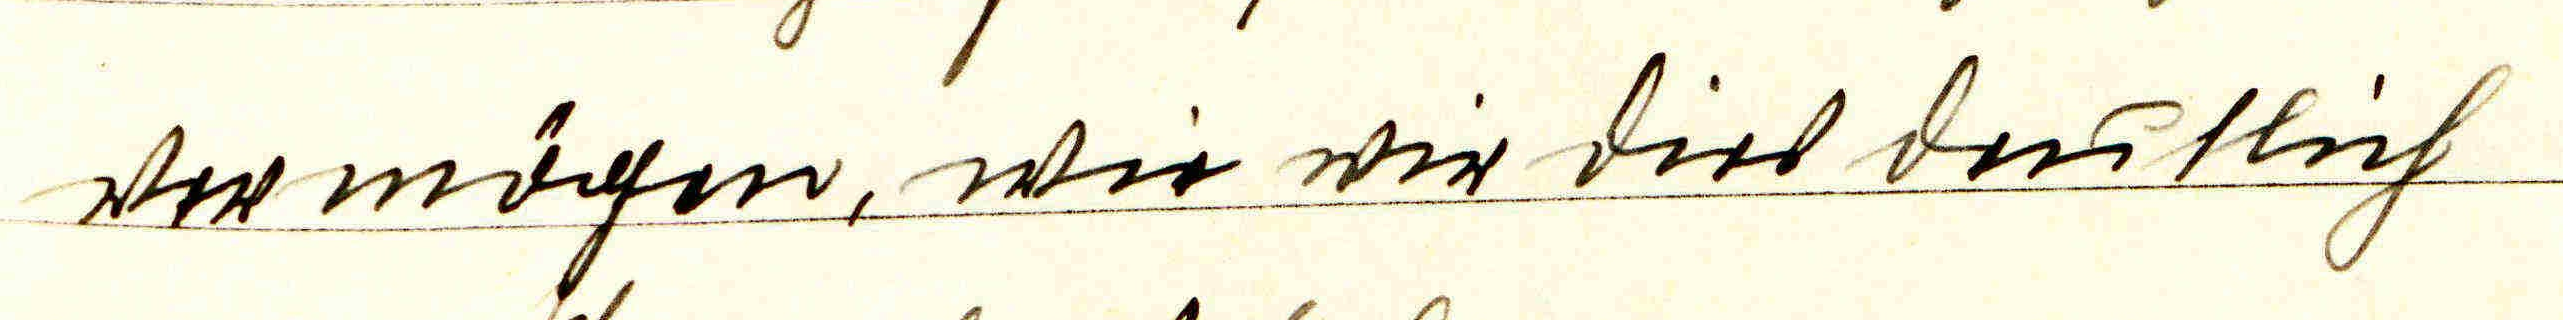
vermögen, wie wir dies deutlich
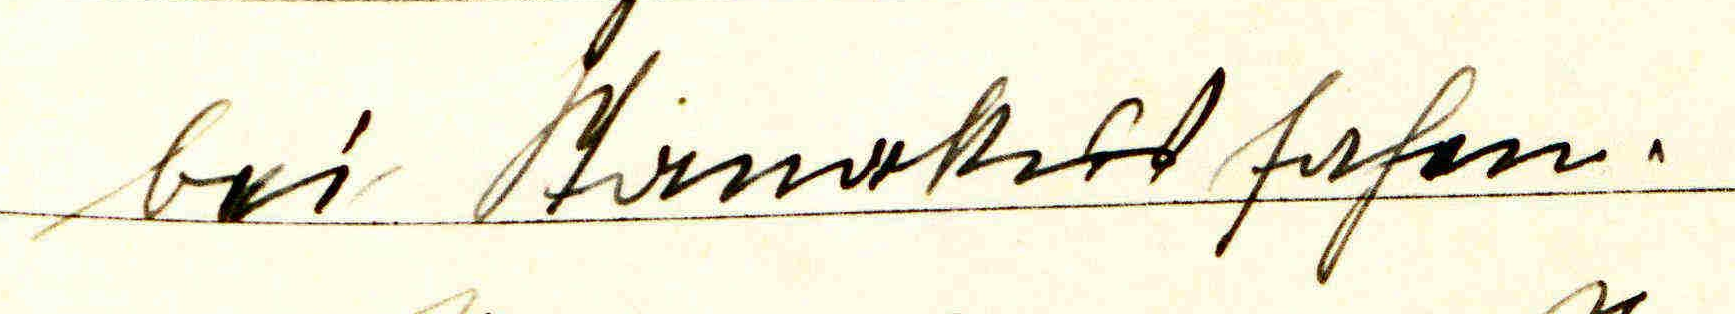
bei Stanakus sahen.
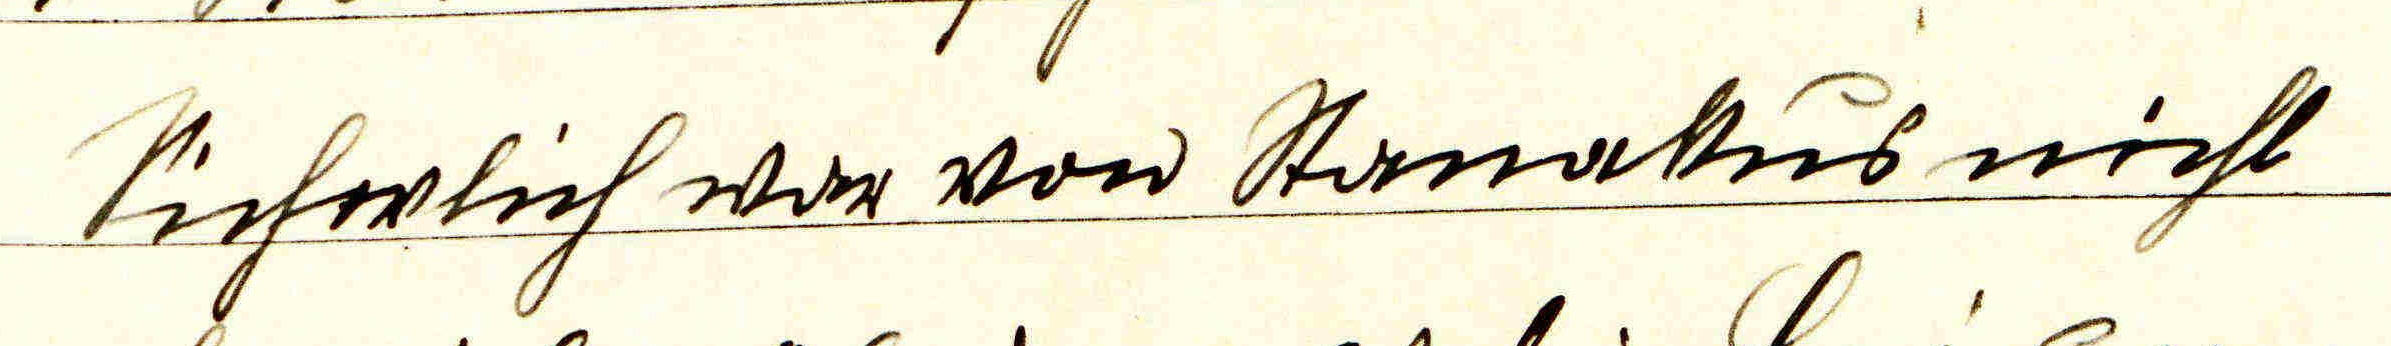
Sicherlich war von Stanakus nicht
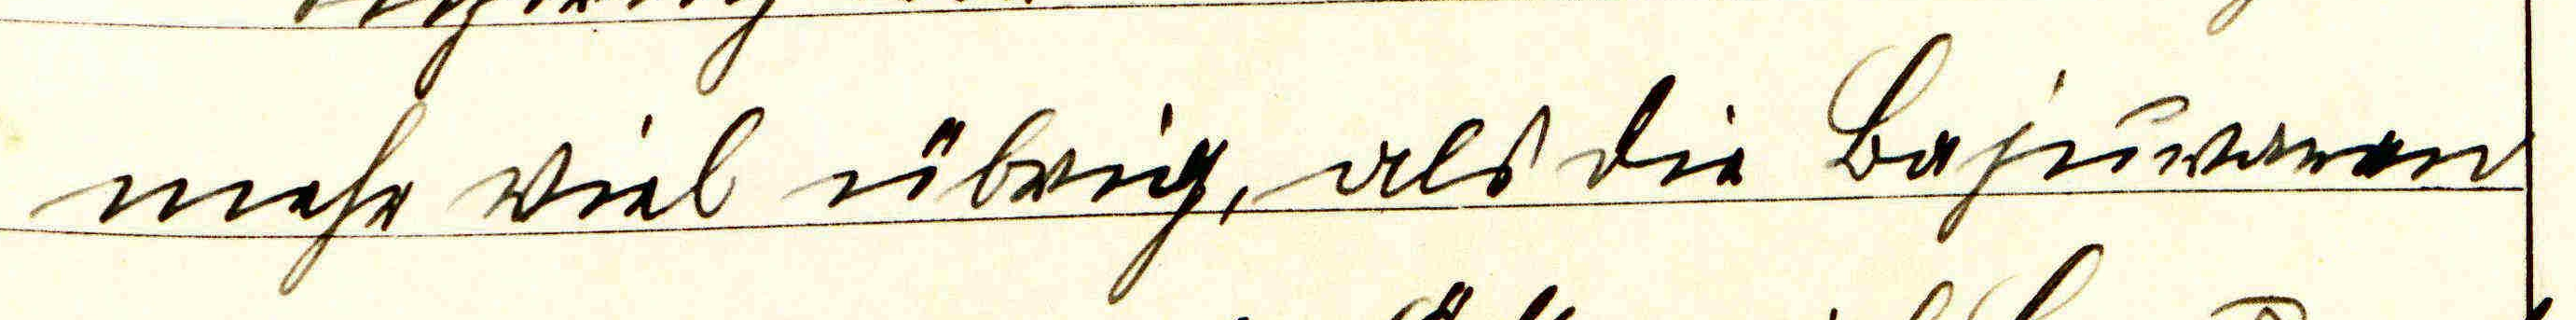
mehr viel übrig, als die Bajuvaren
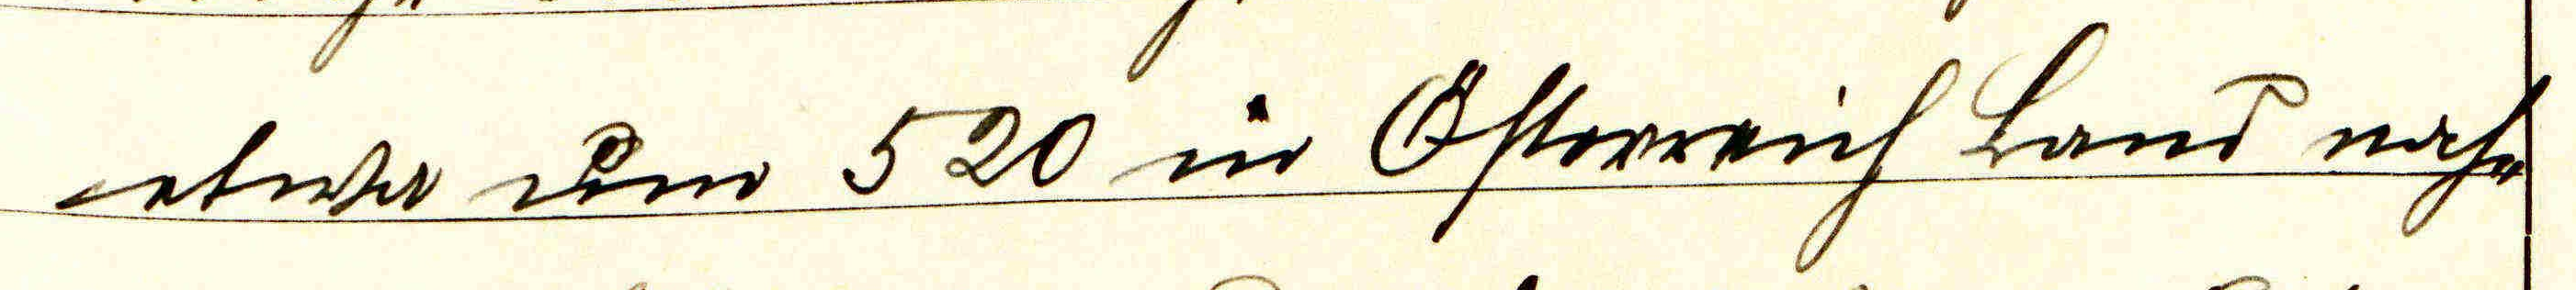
etwa um 520 in Österreich Land nah-
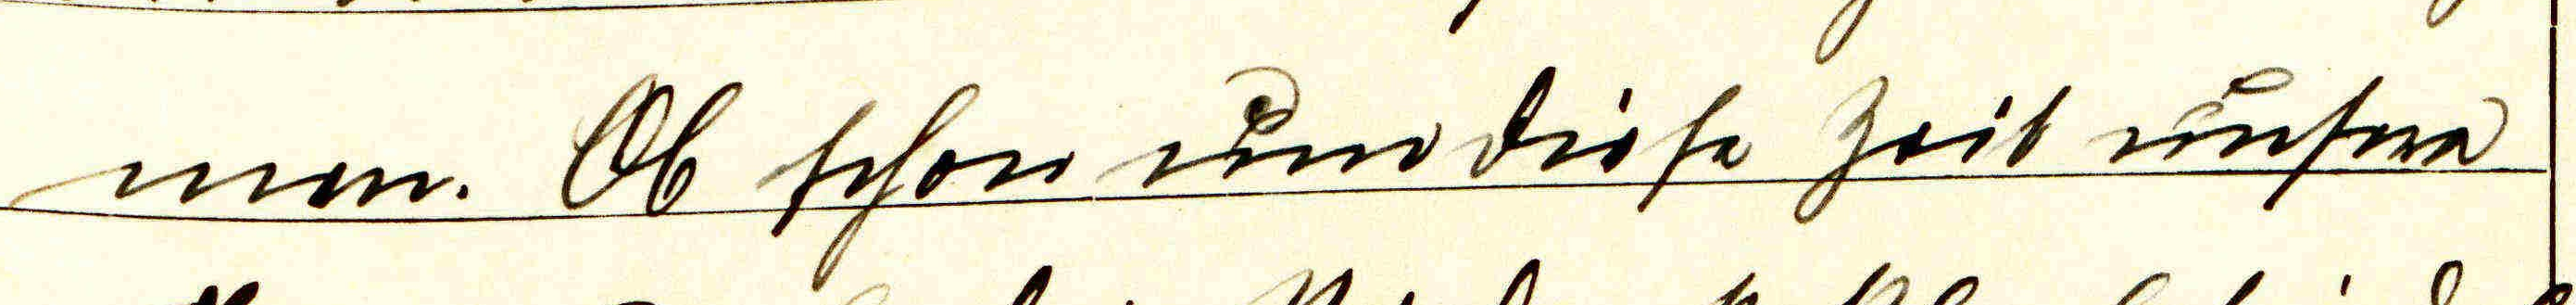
men. Ob schon um diese Zeit unsere
